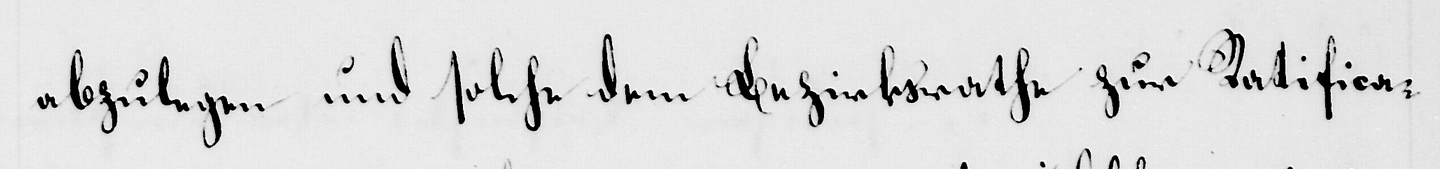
abzulegen und solche dem Bezirksrathe zur Ratifica¬
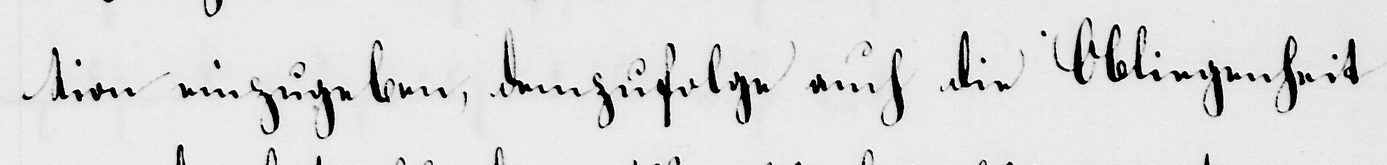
tion einzugeben, demzufolge auch die Obliegenheit
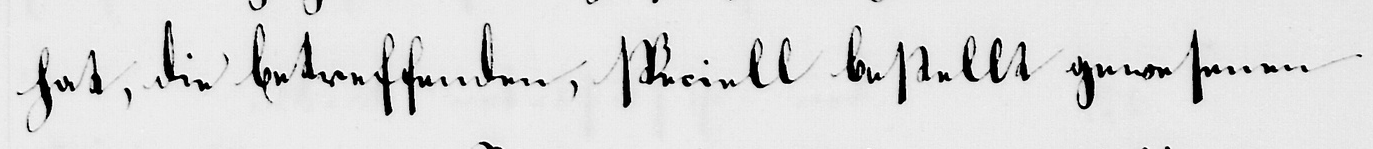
hat, die betreffenden, speciell bestellt gewesenen
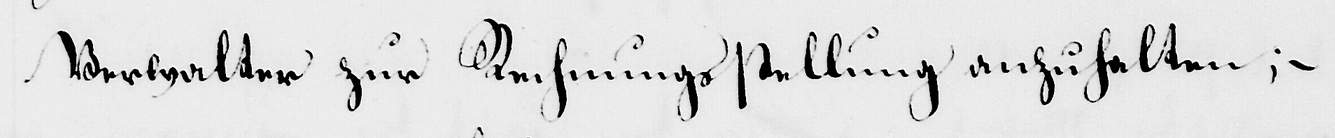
Verwalter zur Rechnungsstellung anzuhalten; –
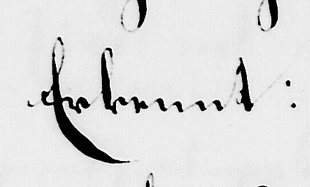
Erkennt:
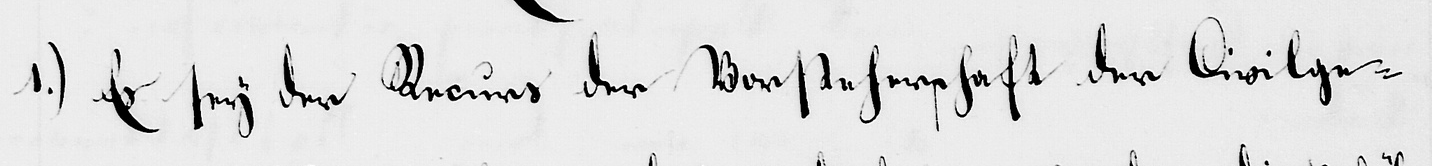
1.) Es sey der Recurs der Vorsteherschaft der Civilge¬
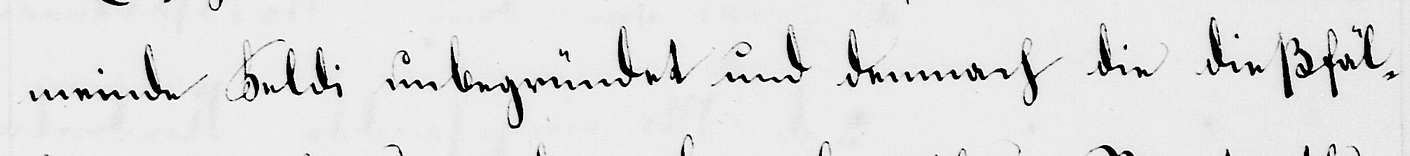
meinde Feldi unbegründet und demnach die dießfäl¬
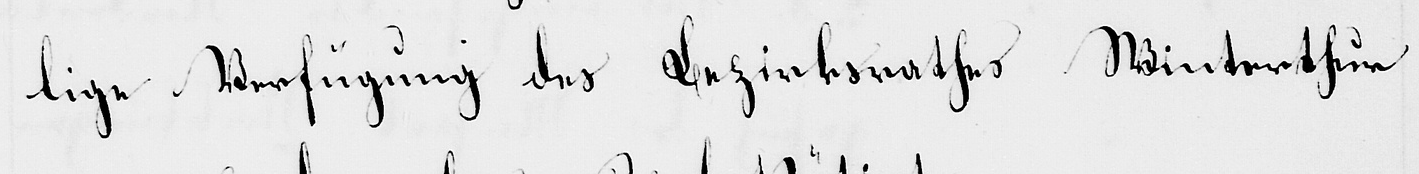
lige Verfügung des Bezirksrathes Winterthur
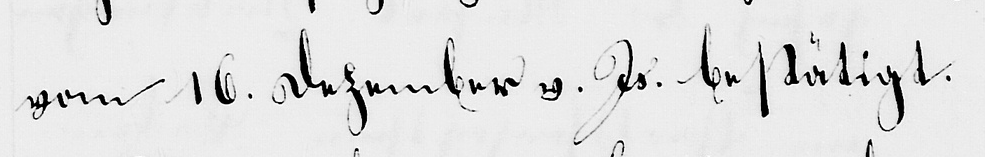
vom 16. Dezember v. Js. bestätigt.
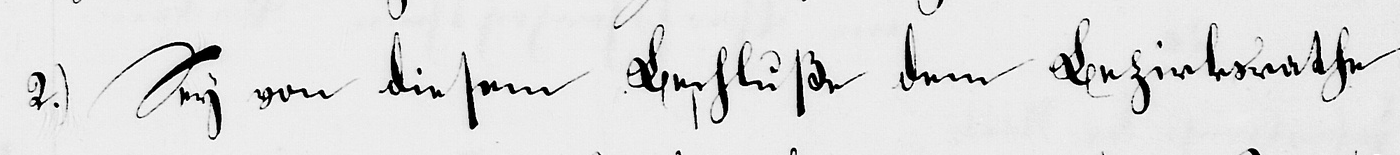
2.) Sey von diesem Beschluße dem Bezirksrathe
